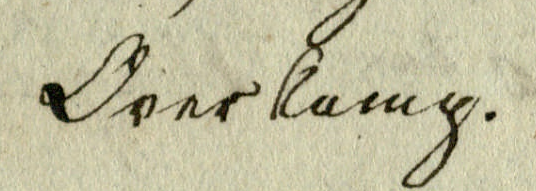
Overkamp.
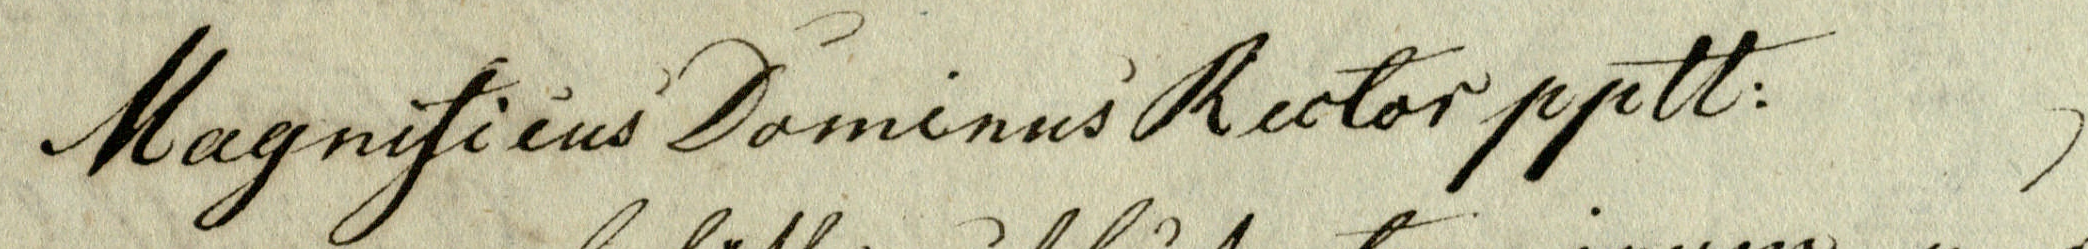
Magnificus Dominus Rector pp tt:
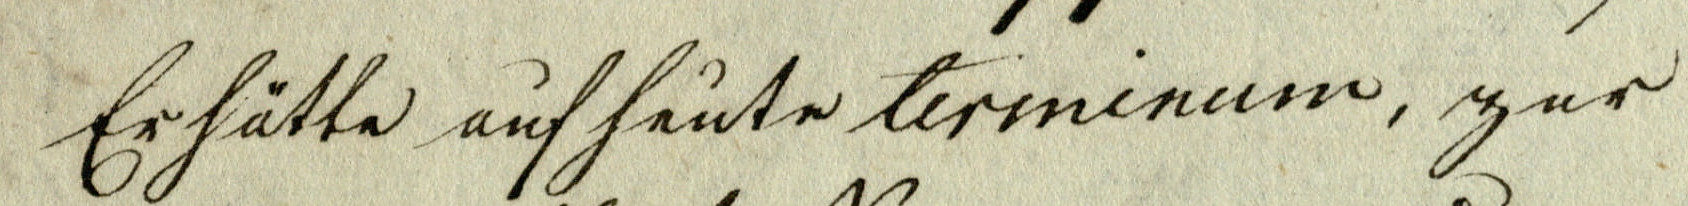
Er hätte auf heute terminum, zur
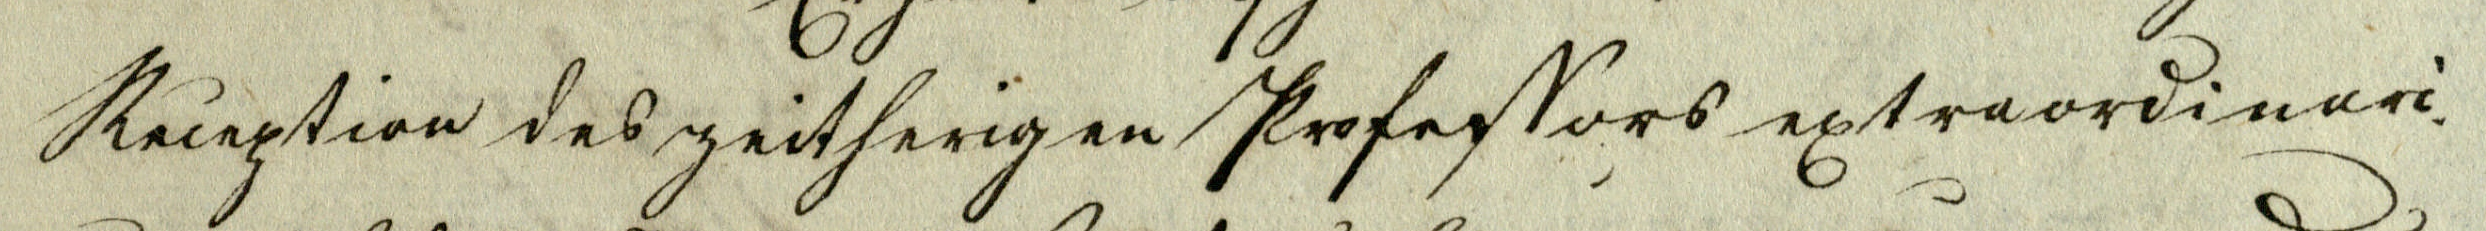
Reception des zeitherigen Professors extraordinari¬
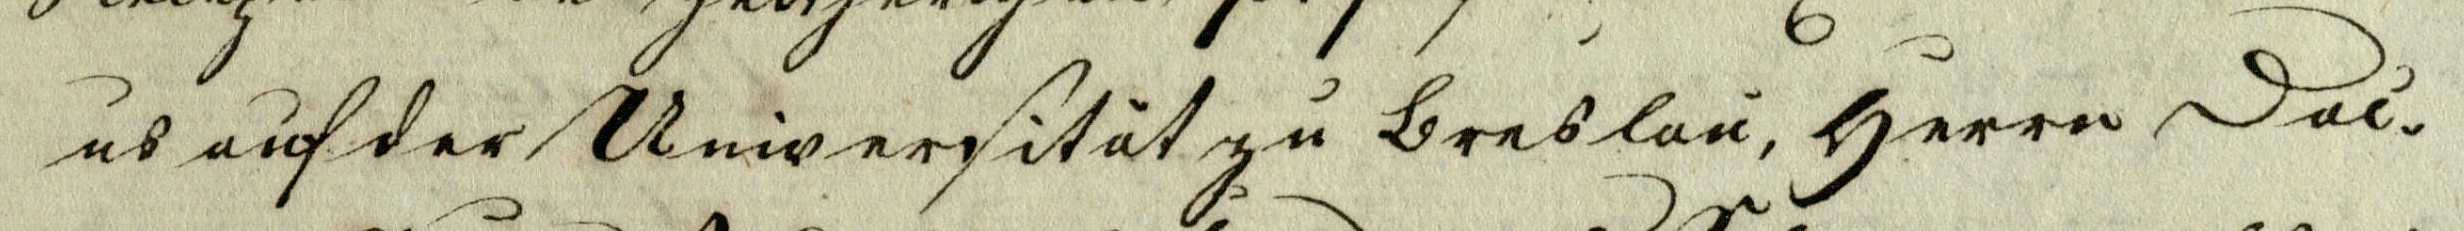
us auf der Universität zu Breslau, Herrn Doc¬
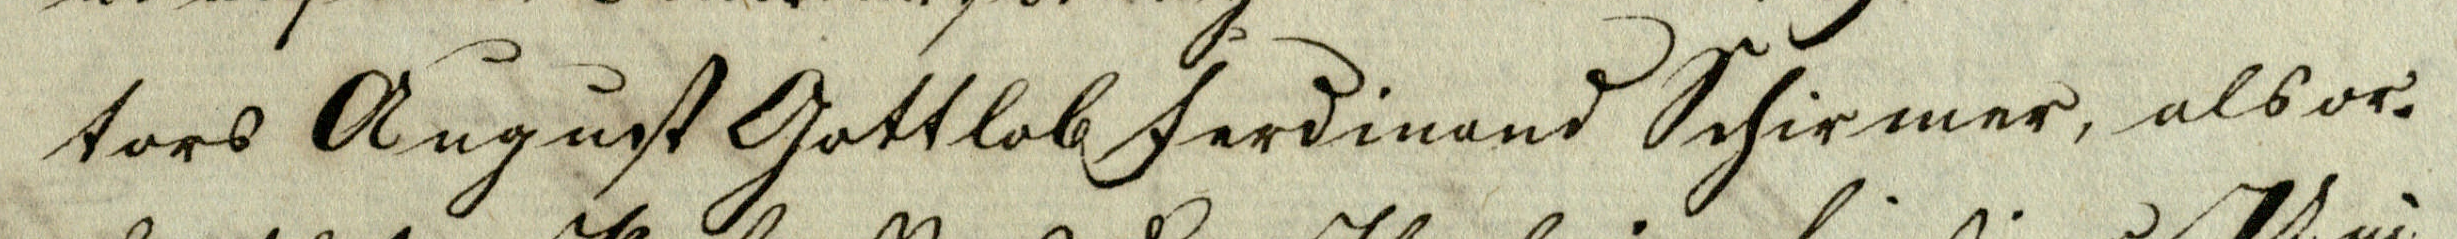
tors August Gottlob Ferdinand Schirmer, als or¬
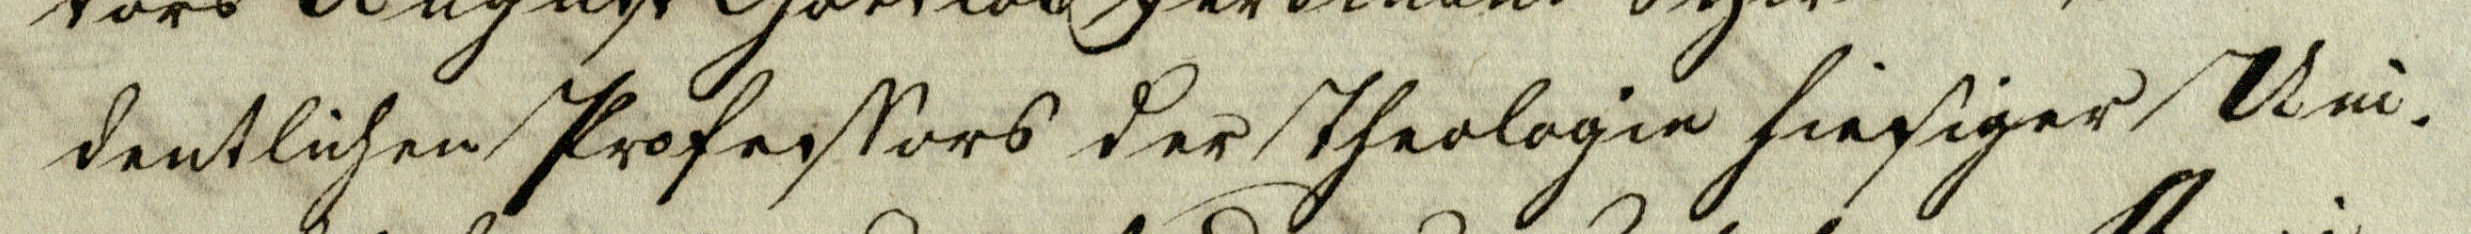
dentlichen Professors der Theologie hiesiger Uni¬
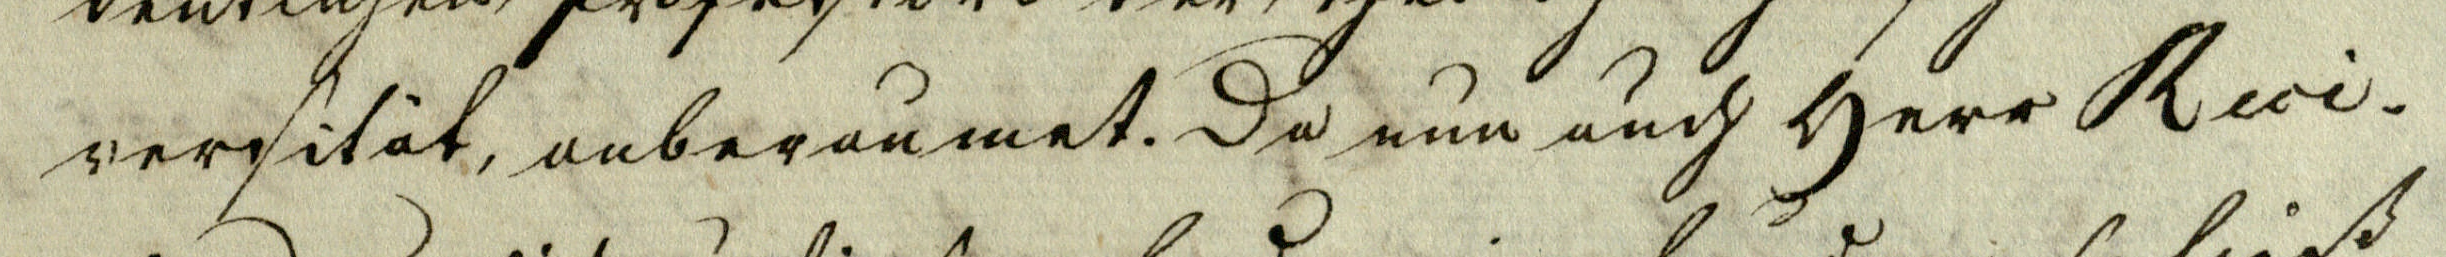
versität, anberaumet. Da nun auch Herr Reci¬
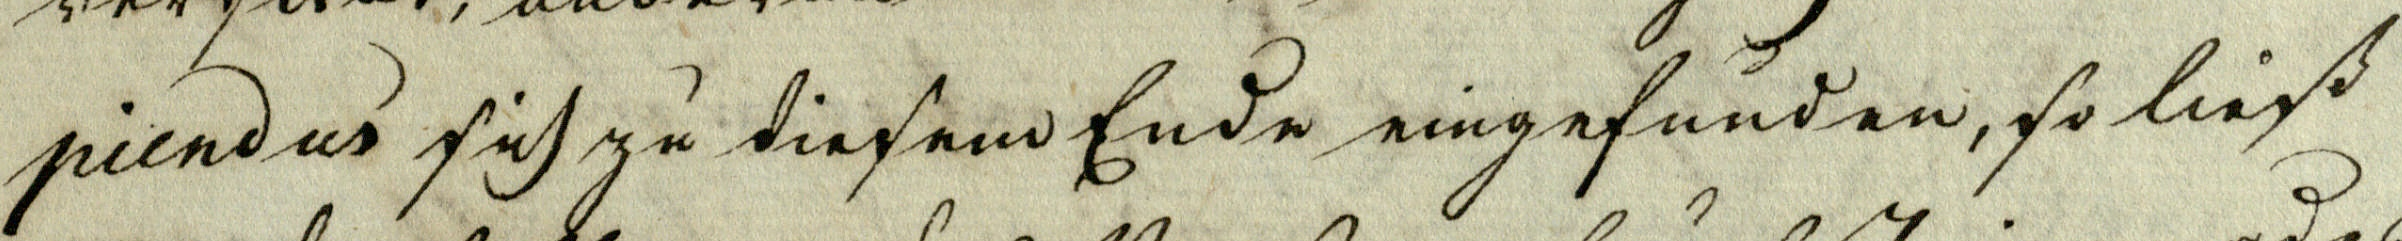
piendus sich zu diesem Ende eingefunden, so ließ
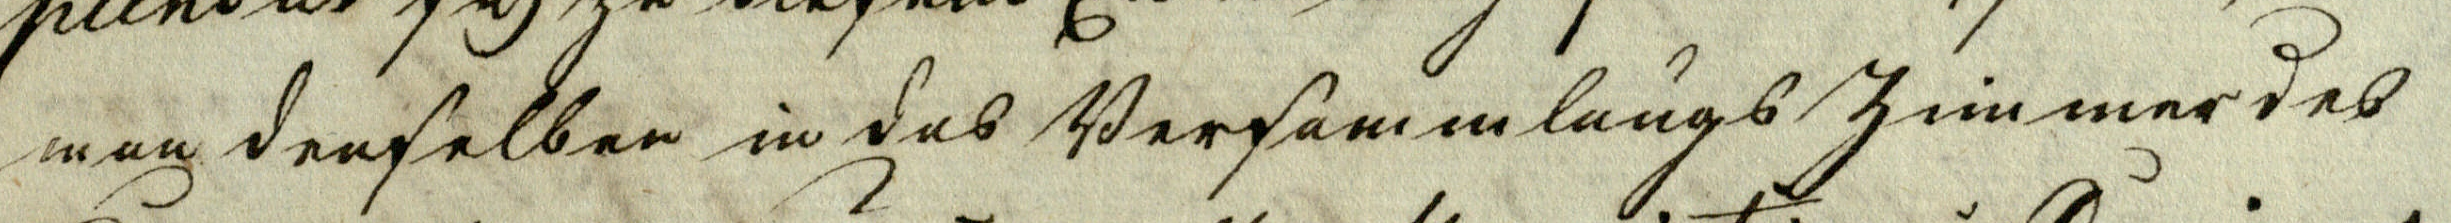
man denselben in das Verammlungs Zimmer des
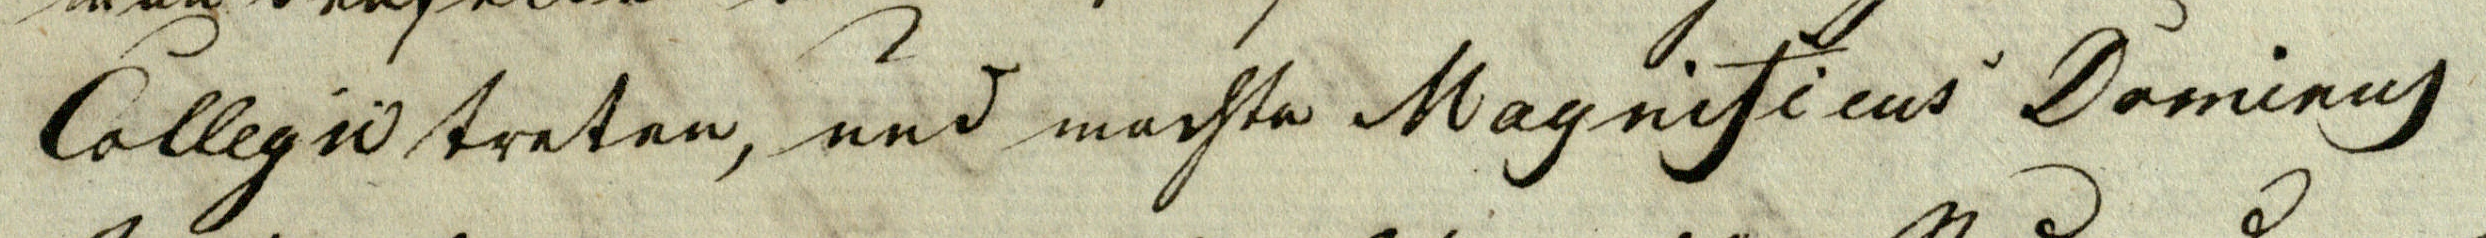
Collegii treten, und machte Magnificus Dominus
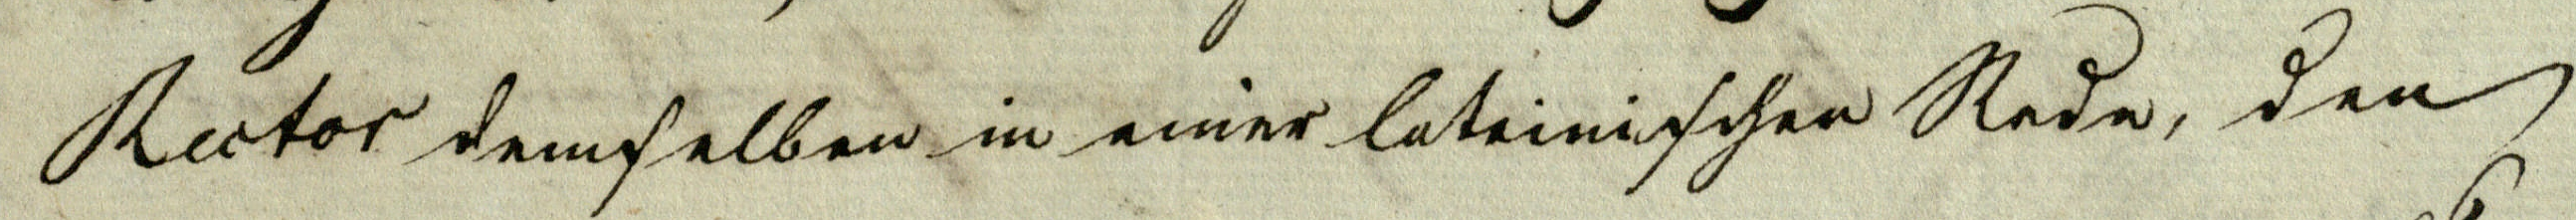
Rector demselben in einer lateinischen Rede, den
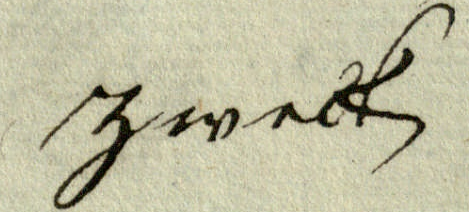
Zweck
